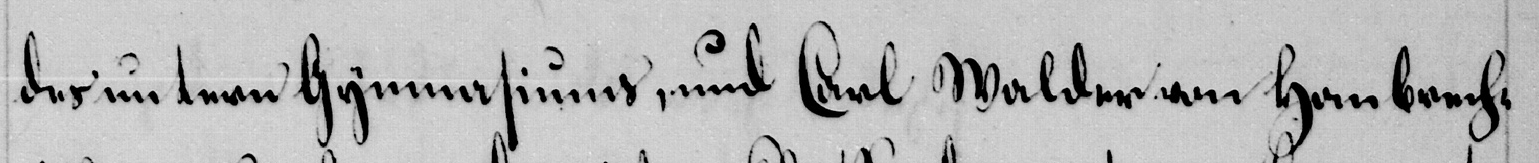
des untern Gymnasiums, und Carl Walder von Hombrech¬
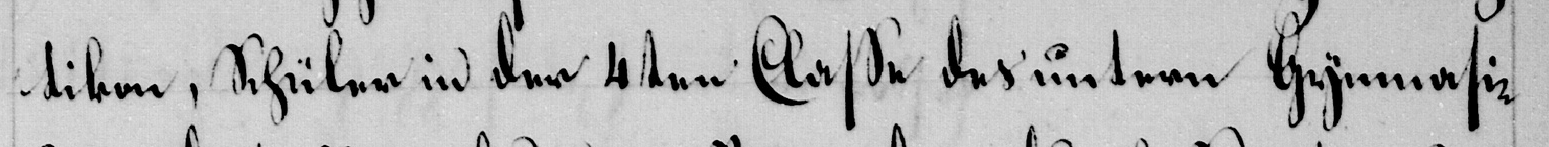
tikon, Schüler in der 4ten Claße des untern Gymnasi¬
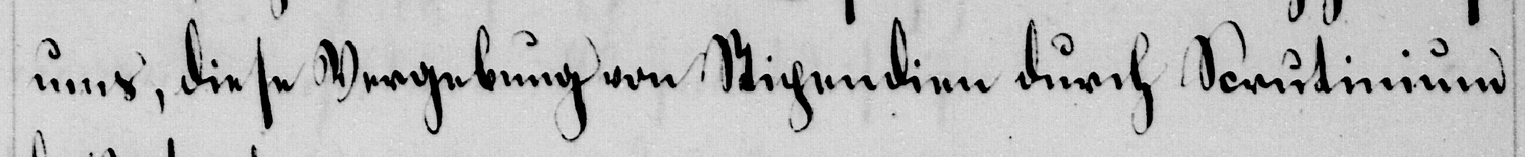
ums, diese Vergebung von Stipendien durch Scrutinium
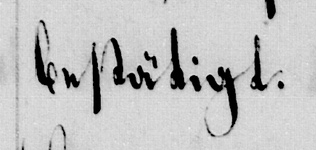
bestätigt.
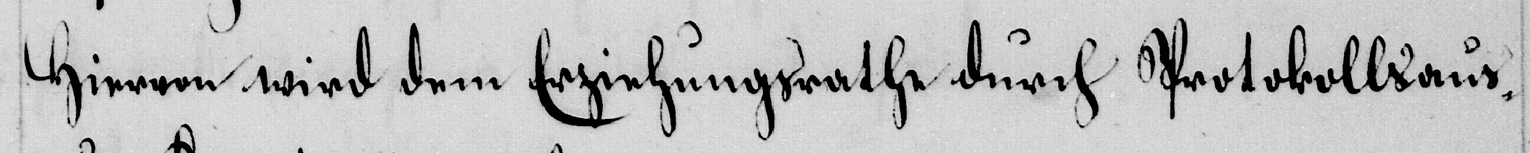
Hiervon wird dem Erziehungsrathe durch Protokollsaus¬
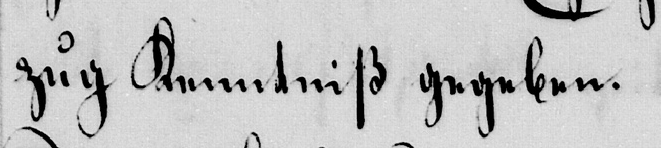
zug Kenntniß gegeben.
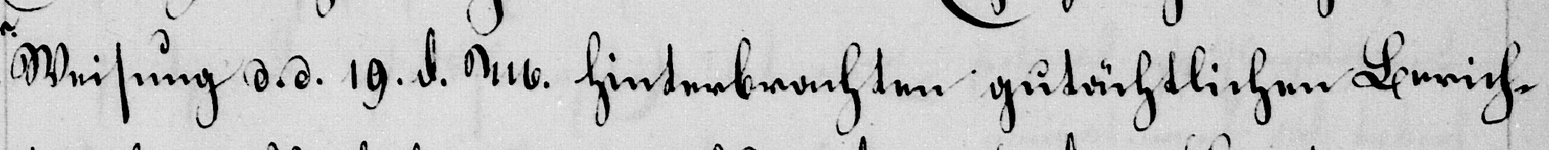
Weisung d. d. 19. d. M. hinterbrachten gutächtlichen Berich¬
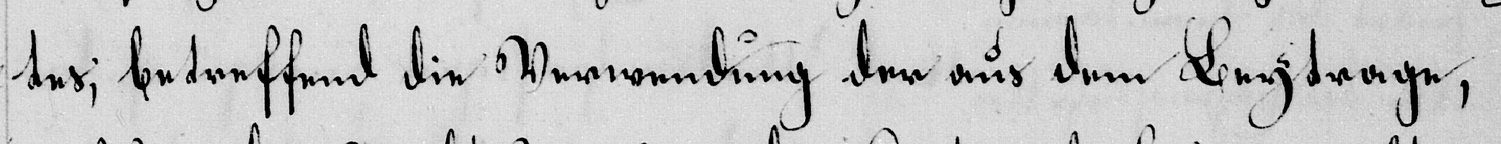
tes, betreffend die Verwendung der aus dem Beytrage,
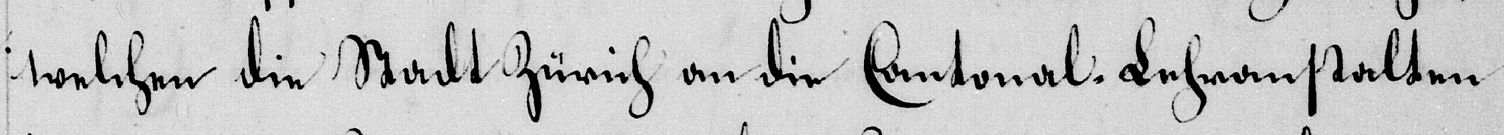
welchen die Stadt Zürich an die Cantonal-Lehranstalten
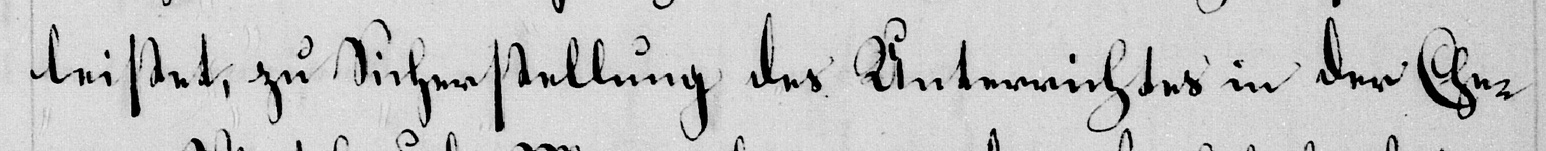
leistet, zu Sicherstellung des Unterrichtes in der Che¬
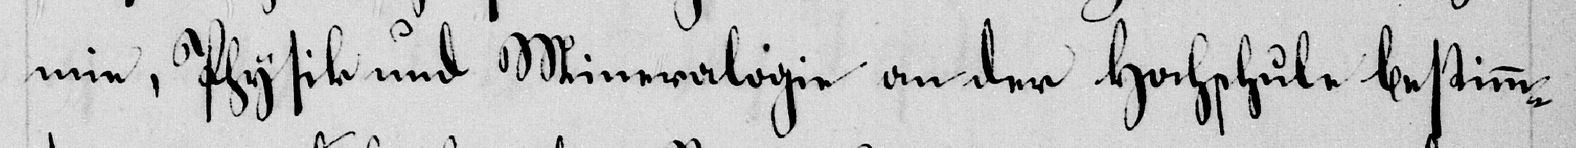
mie, Physik und Mineralogie an der Hochschule bestimm¬
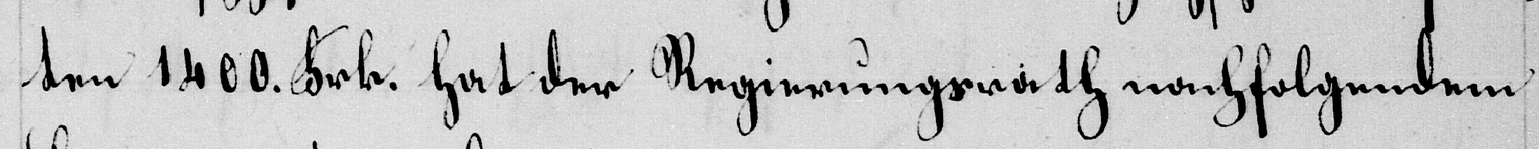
ten 1400. Frk. hat der Regierungsrath nachfolgendem
